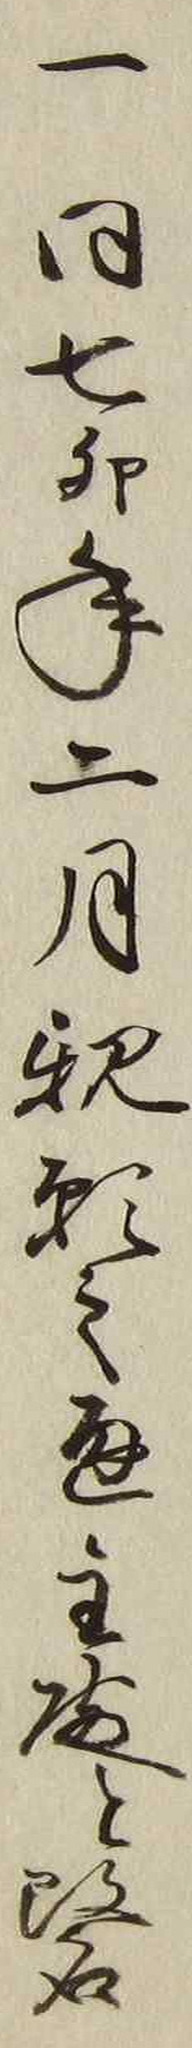一同七卯年二月親願之通主殿と改名
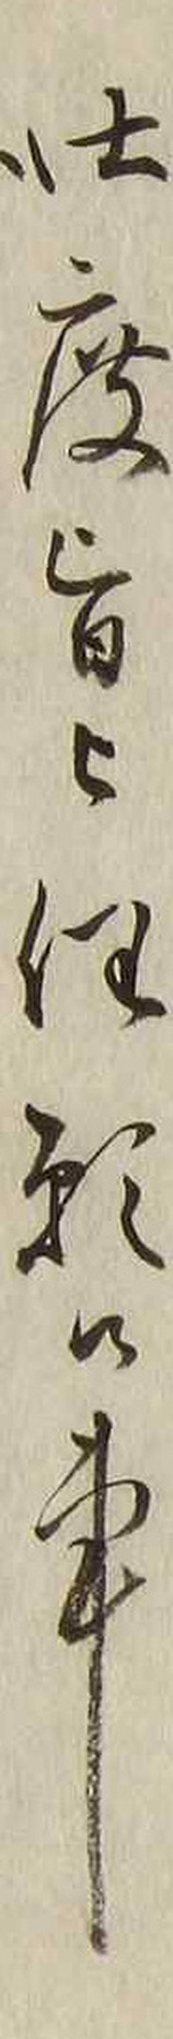仕度旨被任願侯事

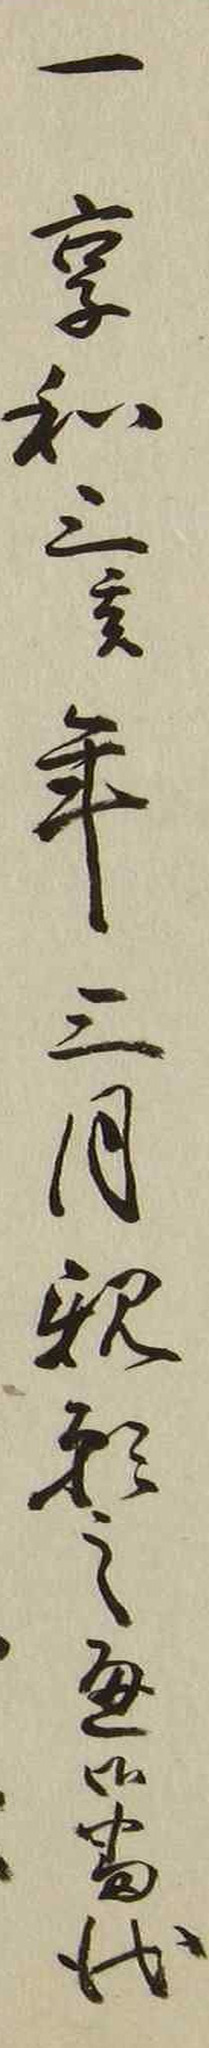一享和三亥年三月親願之通御番代
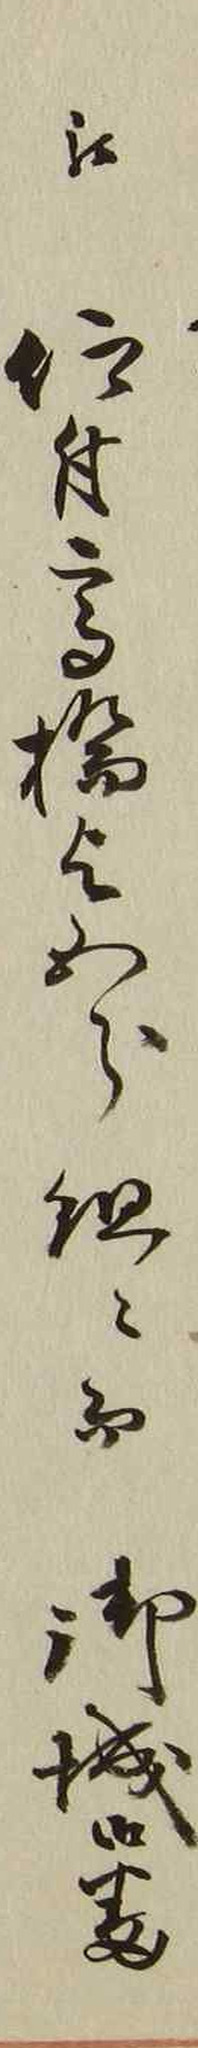被仰付高橋与五分組ニ而御城御番
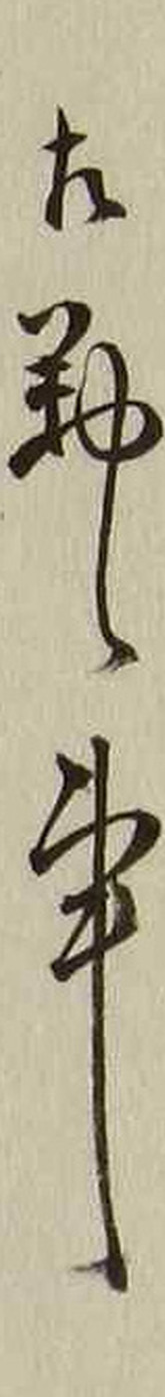相勤候事
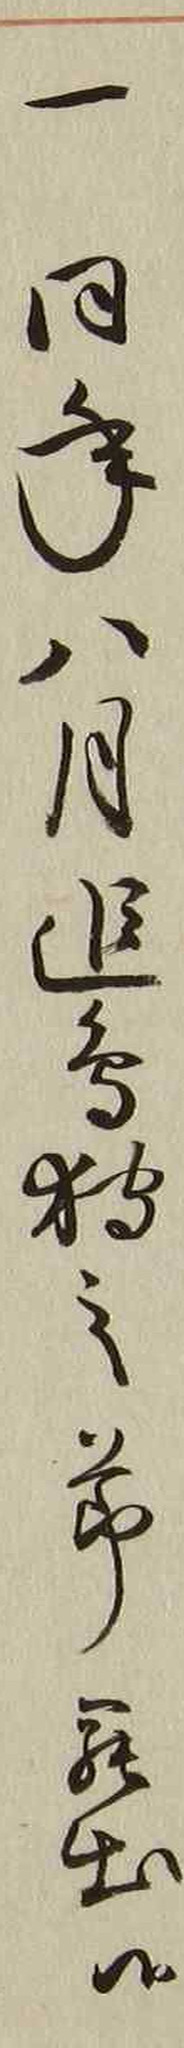一同年八月追鳥狩之節罷出候
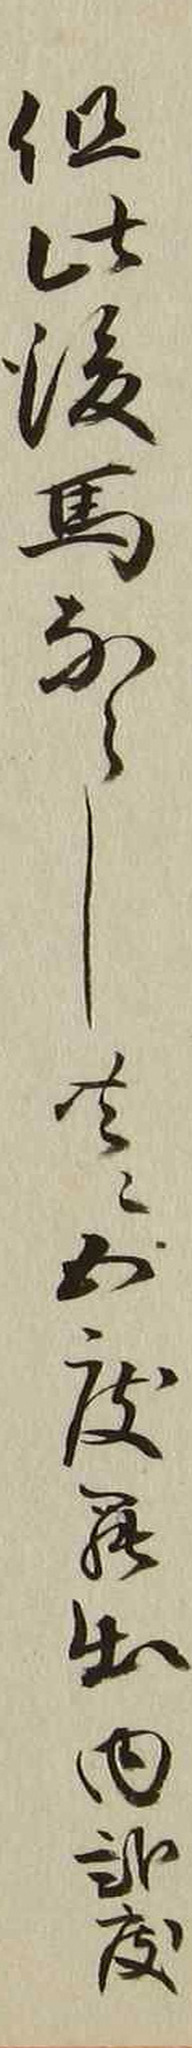但此後馬ならし共ニ五度罷出内弐度
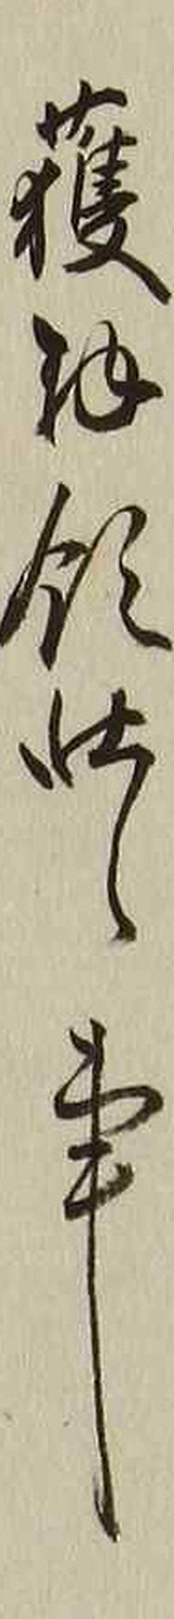獲拝領仕候事
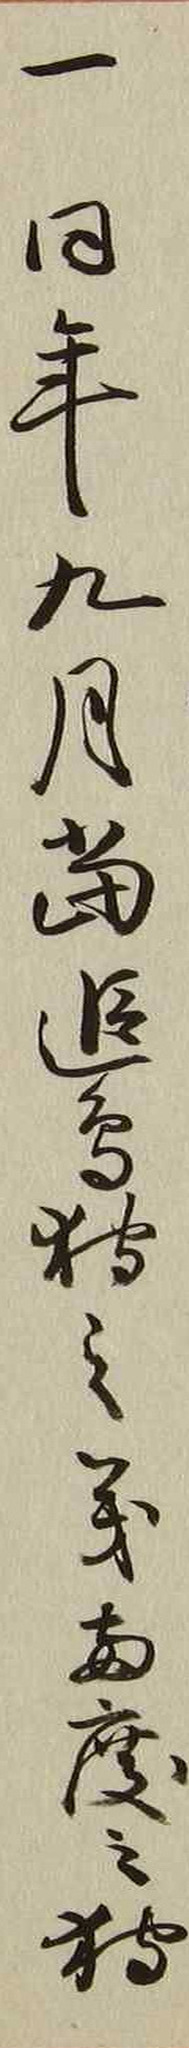一同年九月当追鳥狩之義両度之狩
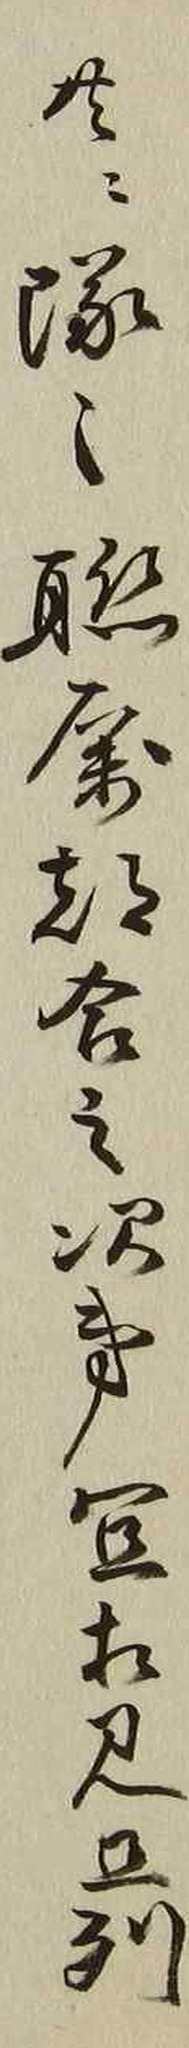共ニ隊々連属都合之次第宜相見且列
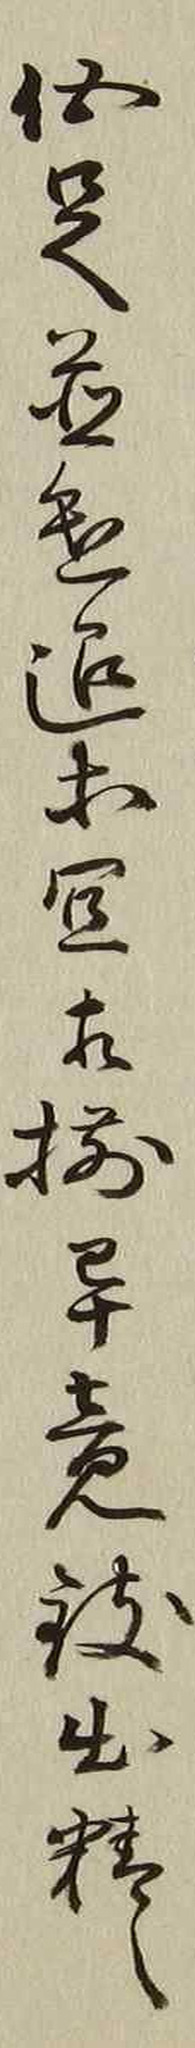伍足並進退等宜相揃畢竟致出精候
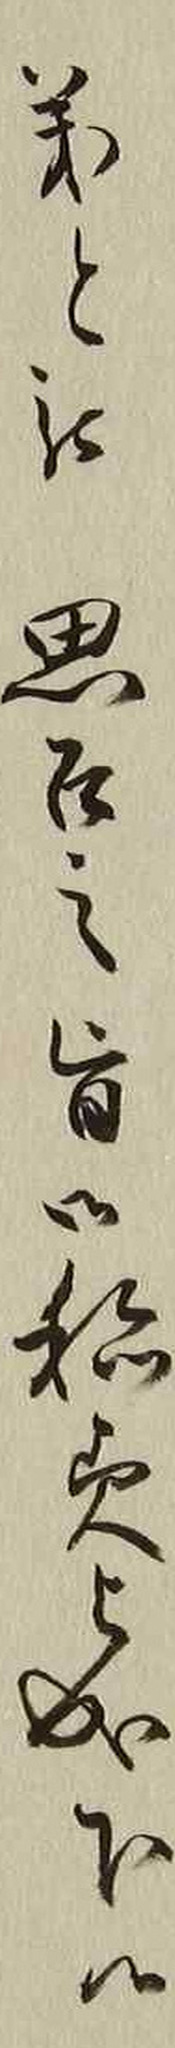義と被思召之旨御称美被成下候
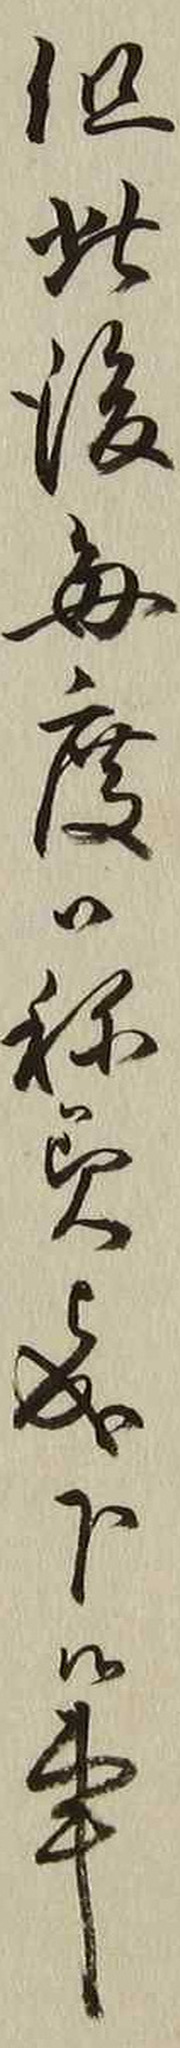但此後毎度御称美被成下候事
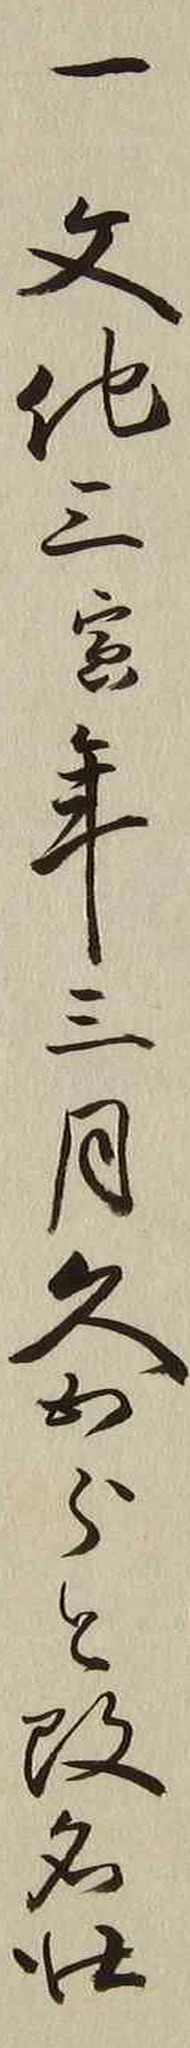一文化三寅年三月久五郎と改名仕
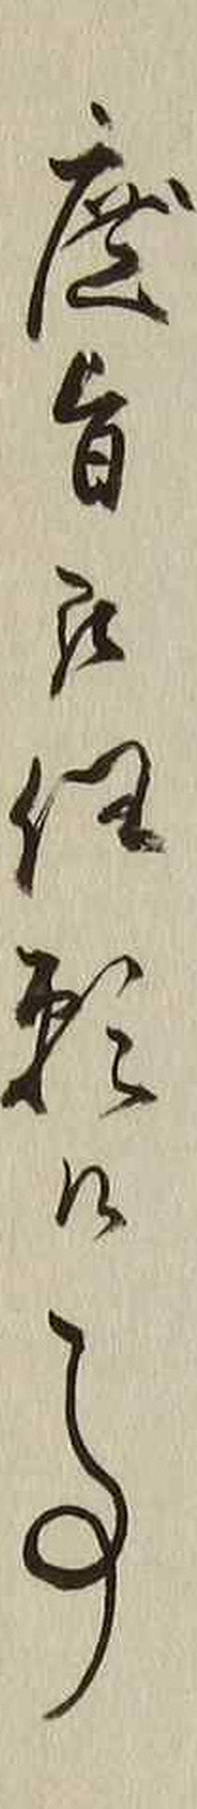度旨被任願候事
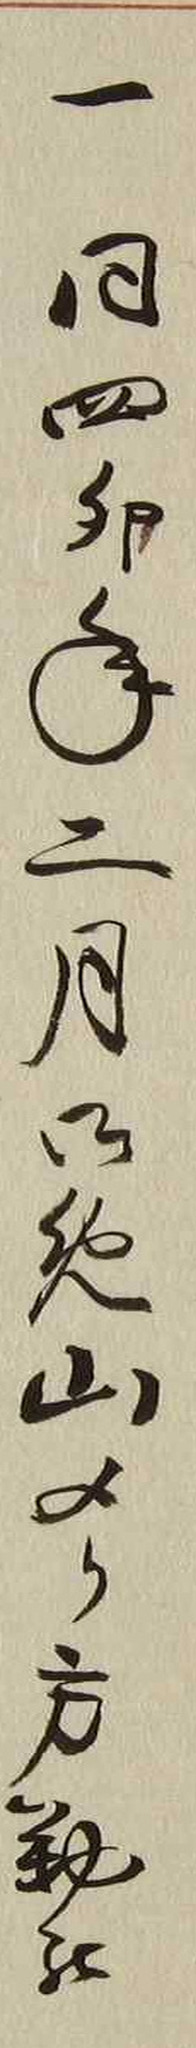一同四卯年二月御免山〆り方勤被
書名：諸士系譜　巻之15　い之部15
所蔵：会津若松市立会津図書館
